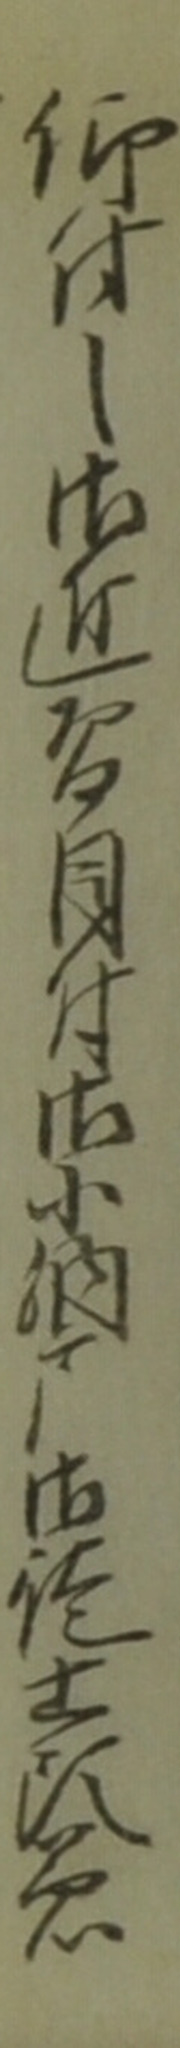仰付之御近習目付御小納戸御徒士頭兼
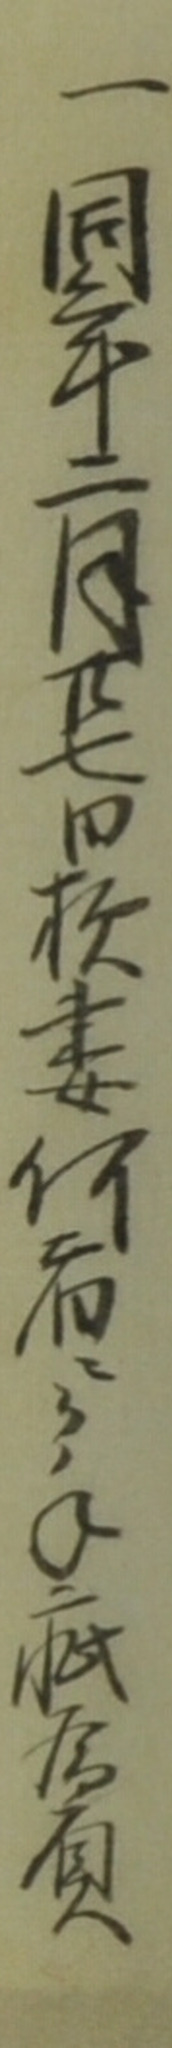一同年二月廿七日夜妻何者ニか手疵為負

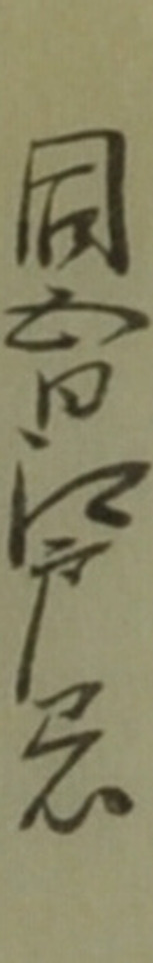同五日江戸着
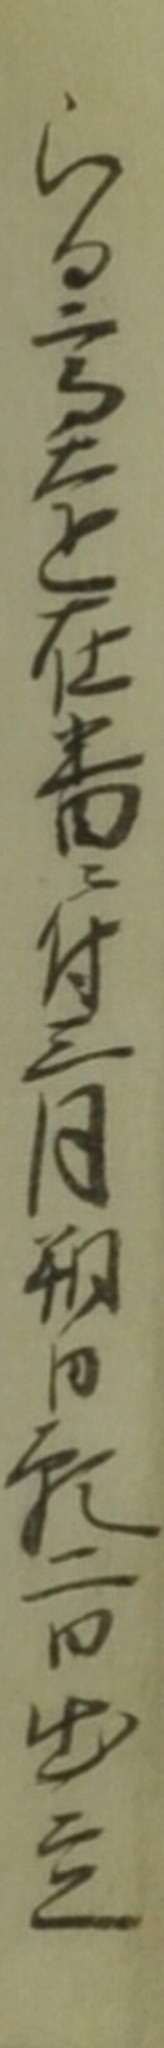らる高遠在番ニ付三月朔日願二日出立
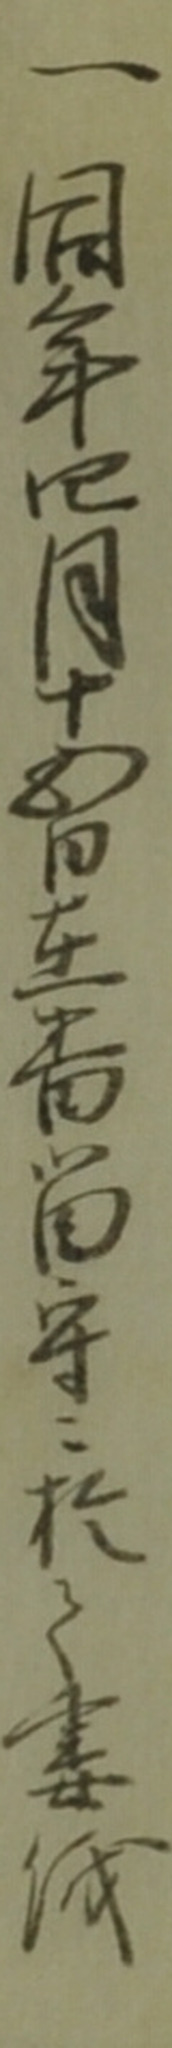一同年四月十五日在番留守ニ於て妻儀
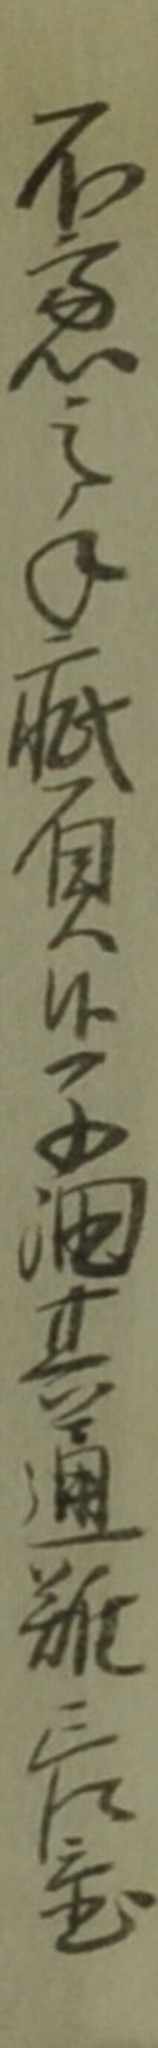不慮之手疵負候子細其通難差置
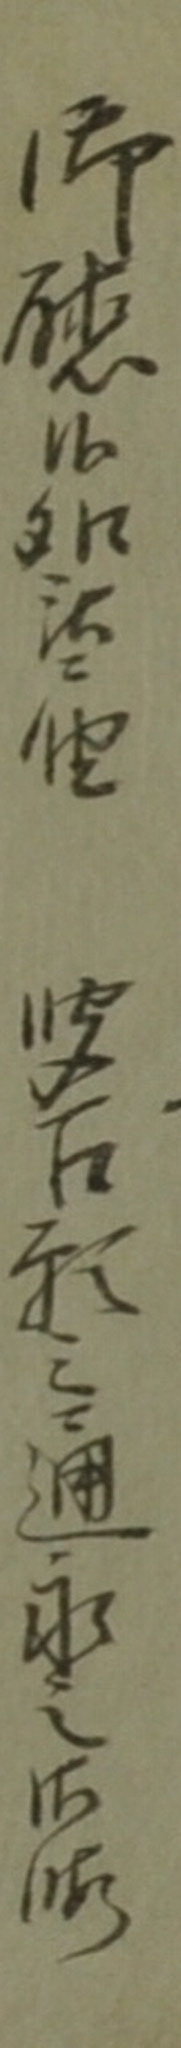御聴候処被届聞召願之通永之御暇
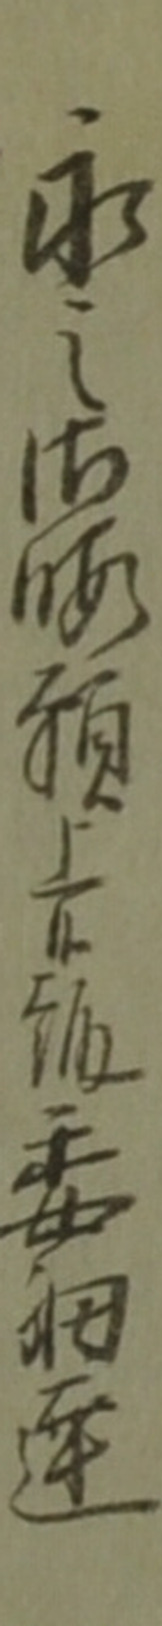永之御暇願上候趣委細達
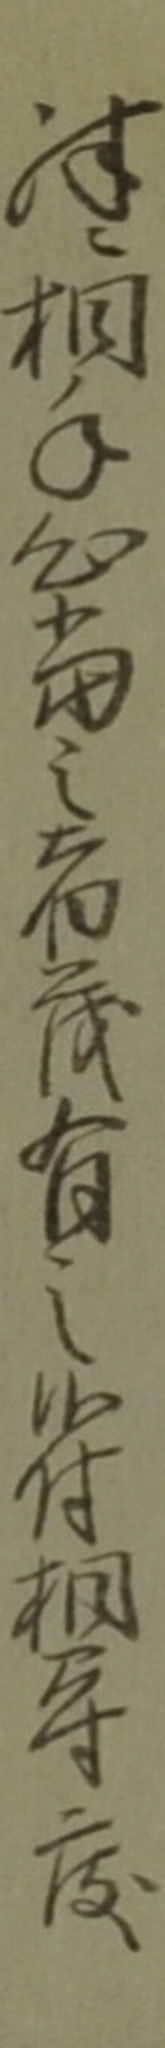殊ニ相手心当之者茂有之候付相尋度
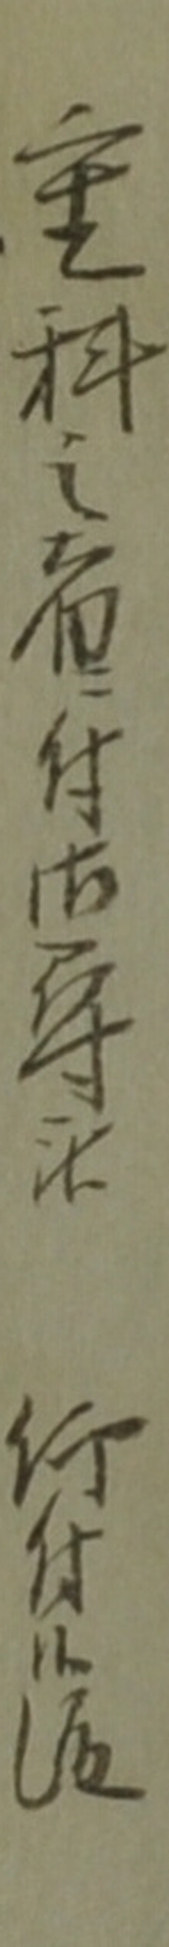重科之者ニ付御尋被仰付候趣
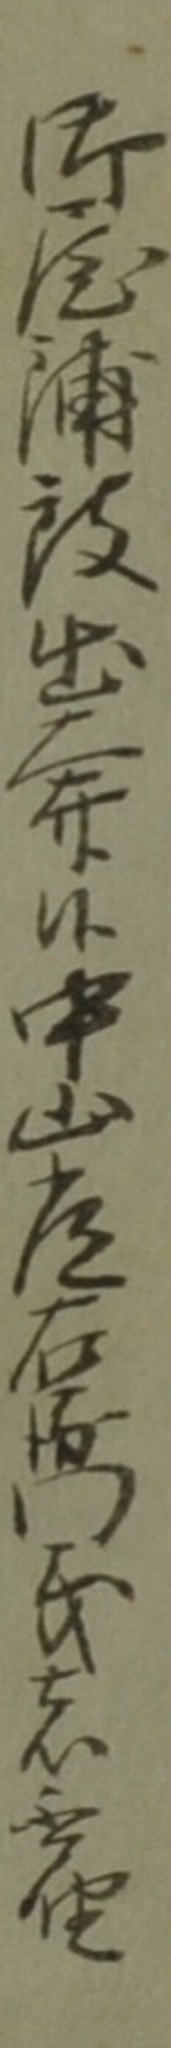御屋鋪致出奔候中山常右衛門義者不届
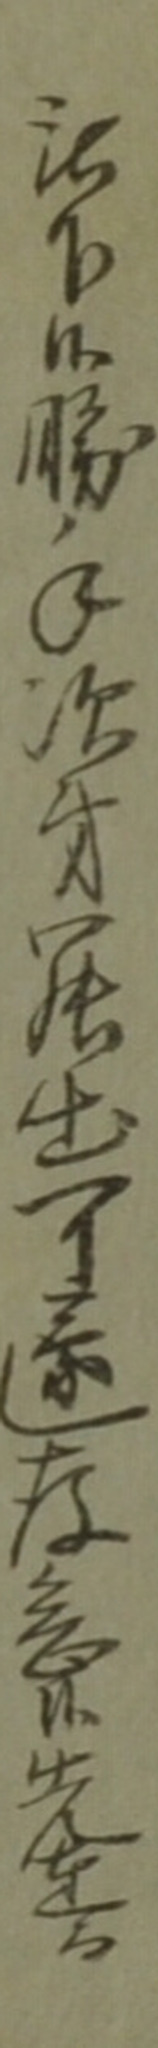被下候勝手次第罷出可遂存念候先達而
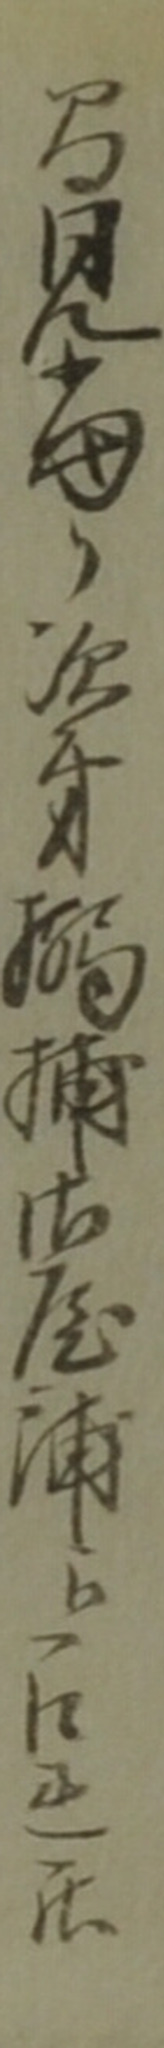間見当り次第搦捕御屋鋪江召連罷
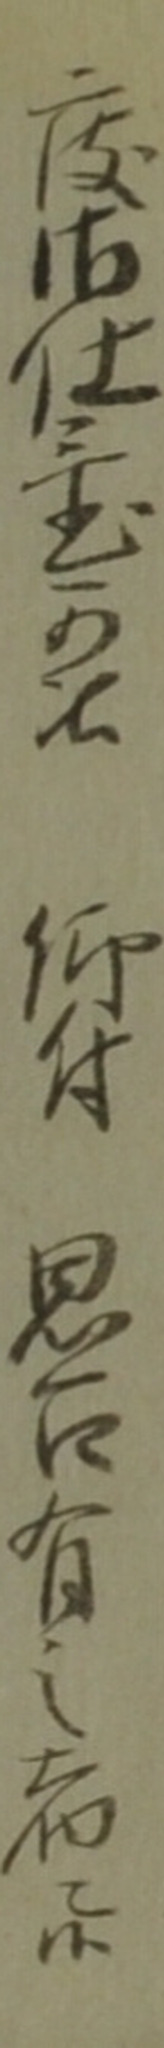度御仕置可被仰付思召有之者ニ候
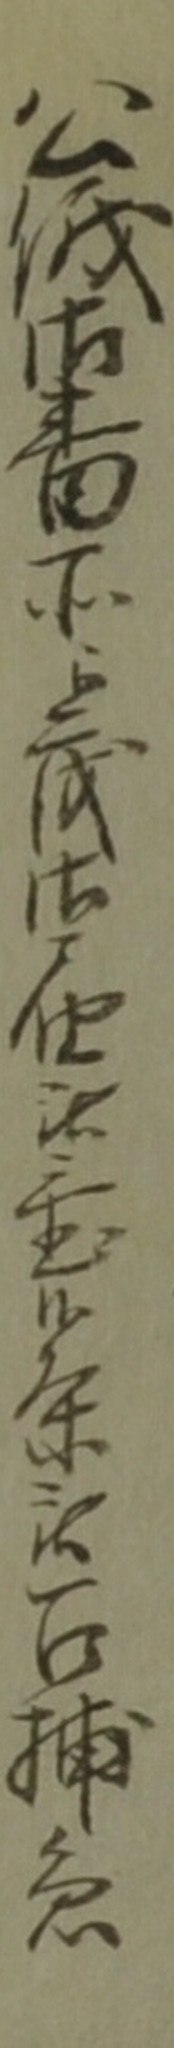公儀御番所江茂御届被置候条被召捕急
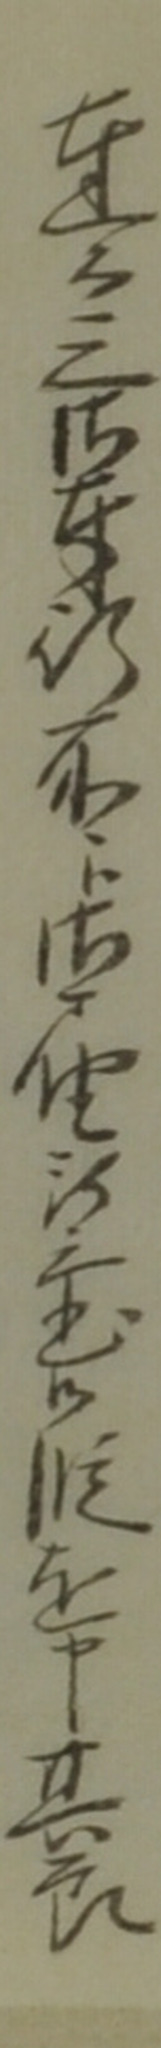達而三御奉行所江御届被置候段を申其節
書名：諸御役代々録（五）
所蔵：伊那市立高遠町図書館・合同会社AMANE
